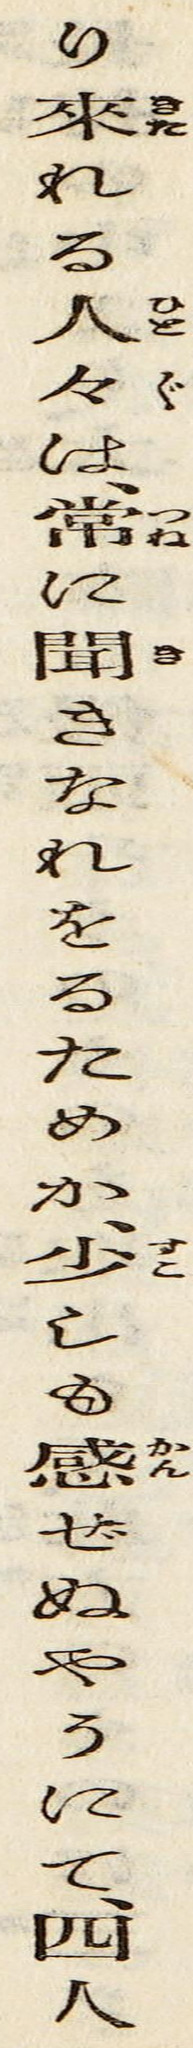り来れる人々は、常に聞きなれをるためか、少しも感ぜぬやうにて、四人
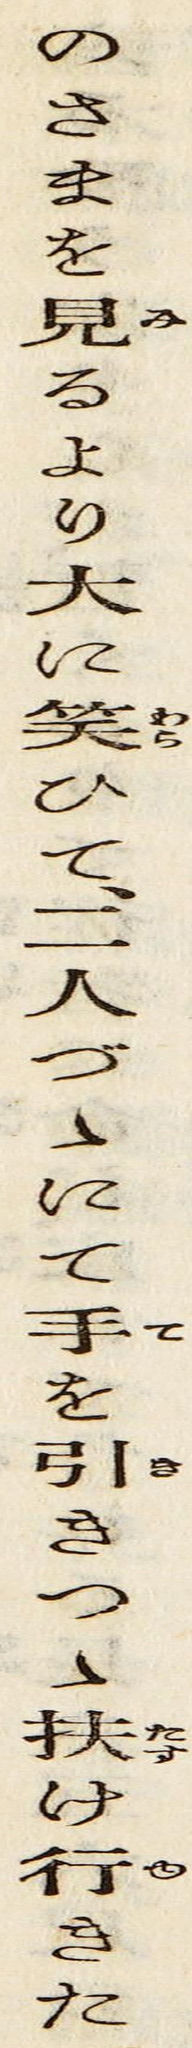のさまを見るより大に笑ひて、二人づゝにて手を引きつゝ扶け行きた
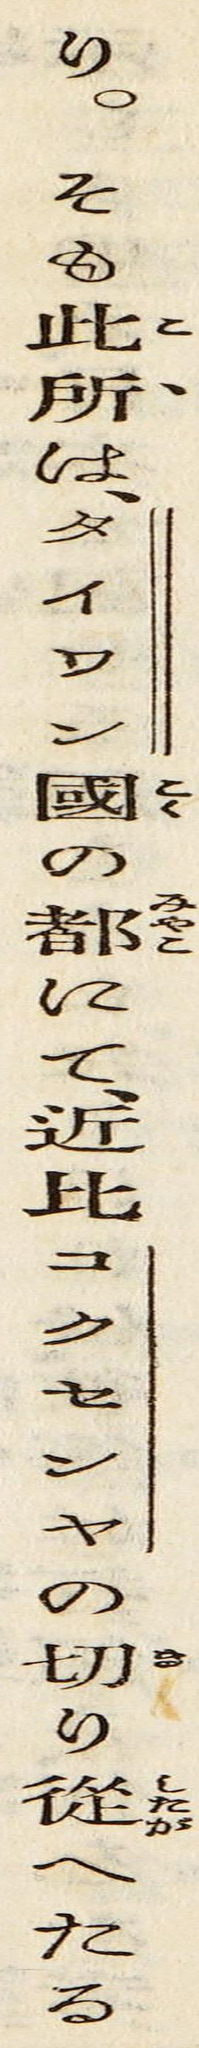り。そも此所は、タイワン国の都にて、近比コクセンヤの切り従へたる
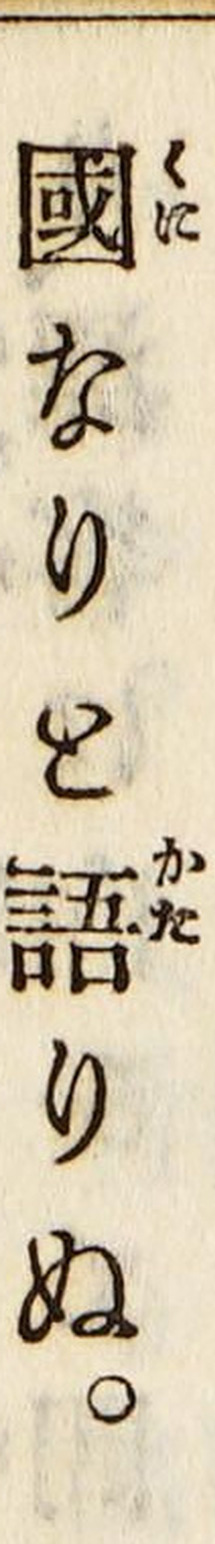国なりと語りぬ。
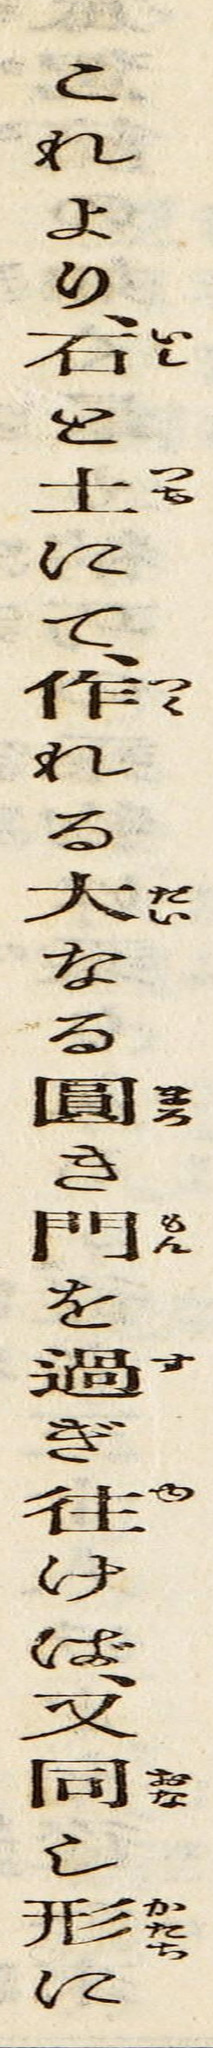これより、石と土にて、作れる大なる円き門を過ぎ往けば、又同し形に
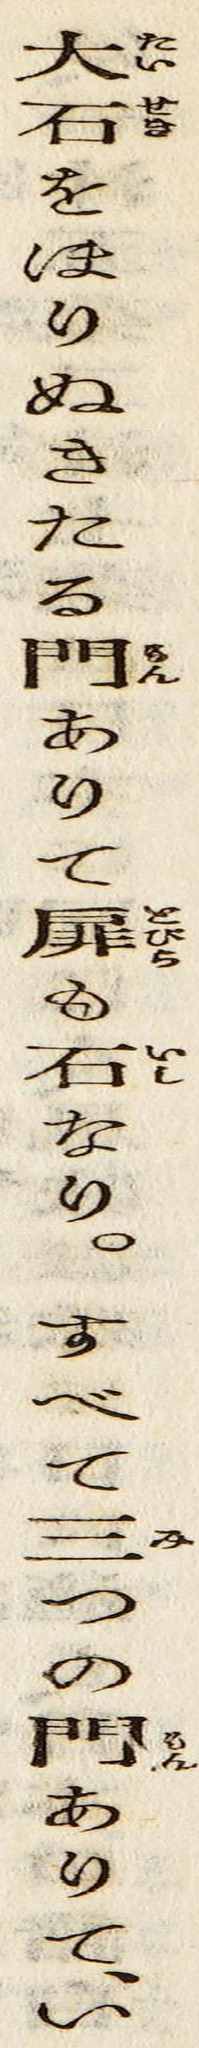大石をほりぬきたる門ありて扉も石なり。すべて三つの門ありて、い
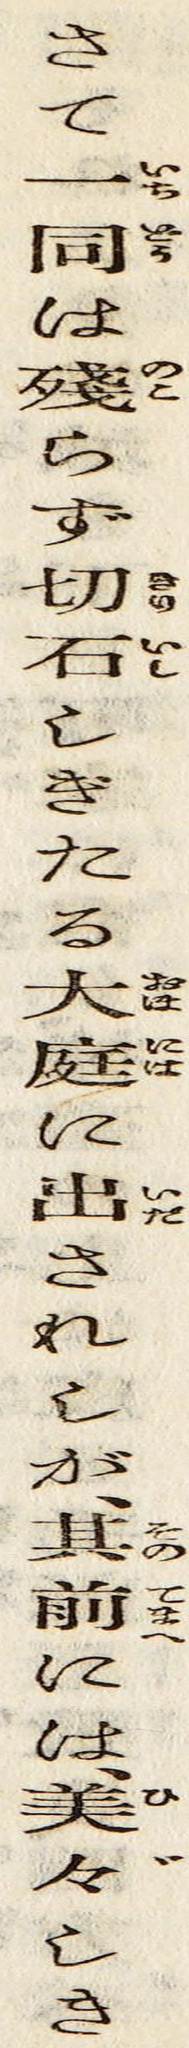さて一同は残らず切石しきたる大庭に出されしが、其前には、美々しき
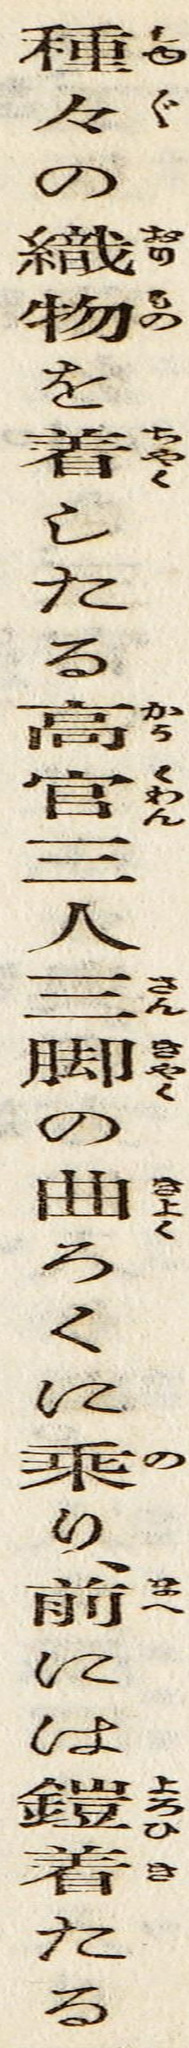種々の織物を着したる高官三人三脚の曲ろくに乗り、前には鎧着たる
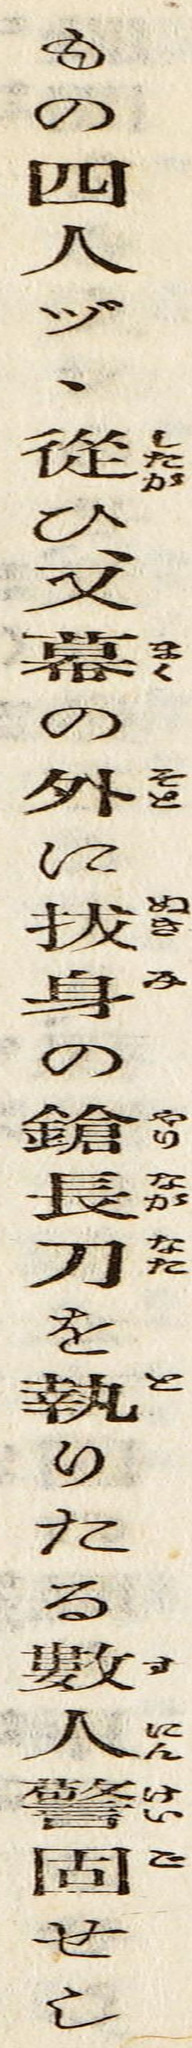もの四人ヅヽ従ひ、又幕の外に抜身の鎗長刀を執りたる数人警固せし
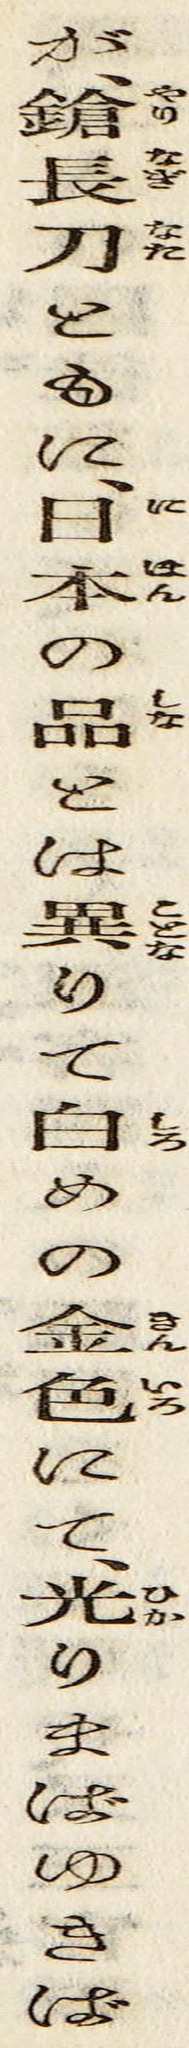が、鎗長刀ともに、日本の品とは異りて白めの金色にて、光りまばゆきば
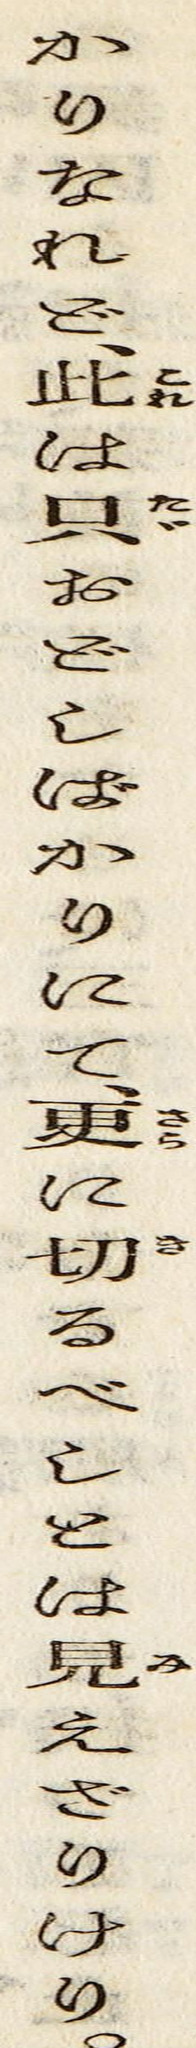かりなれど、此は只おどしばかりにて、更に切るべしとは見えざりけり。
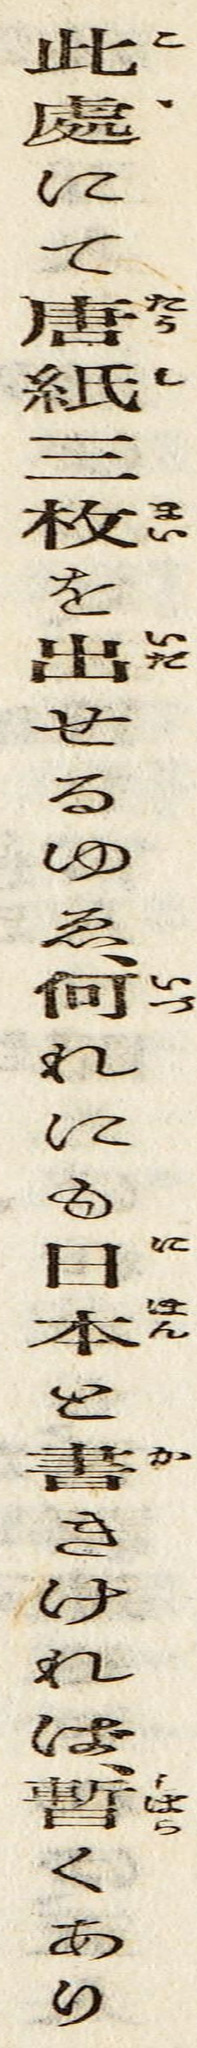此処にて唐紙三枚を出せるゆゑ、何れにも日本と書きければ、暫くあり
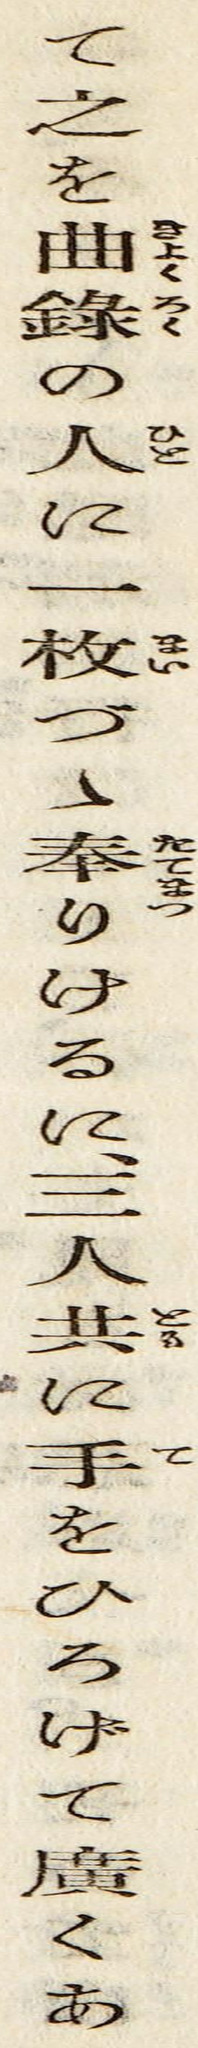て之を曲録の人に一枚づゝ奉りけるに、三人共に手をひろげて広くあ
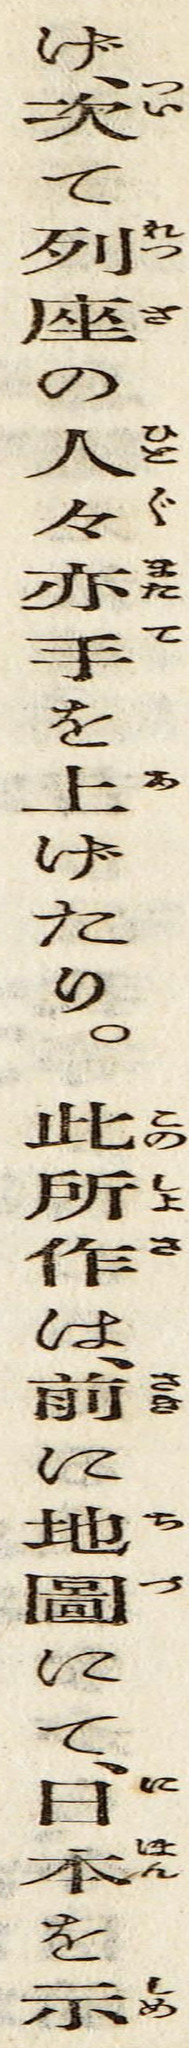げ、次て列座の人々亦手を上げたり。此所作は、前に地図にて、日本を示
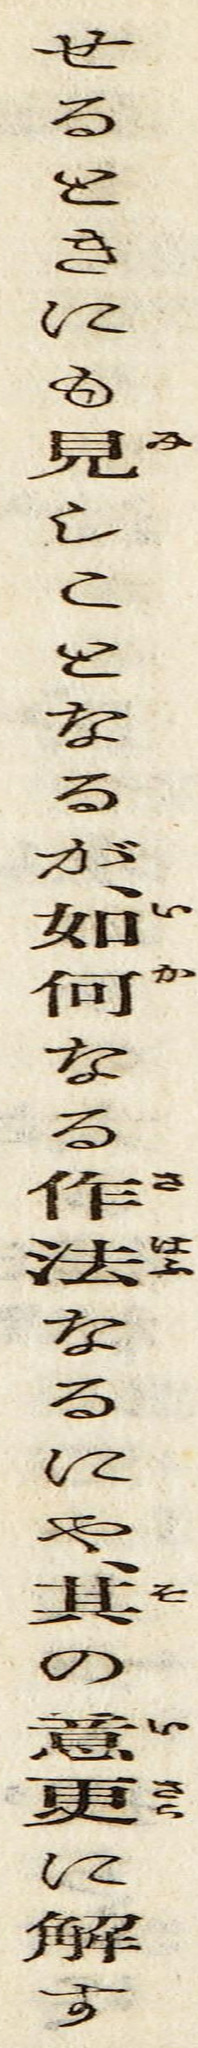せるときにも見しことなるが、如何なる作法なるにや、其の意更に解す

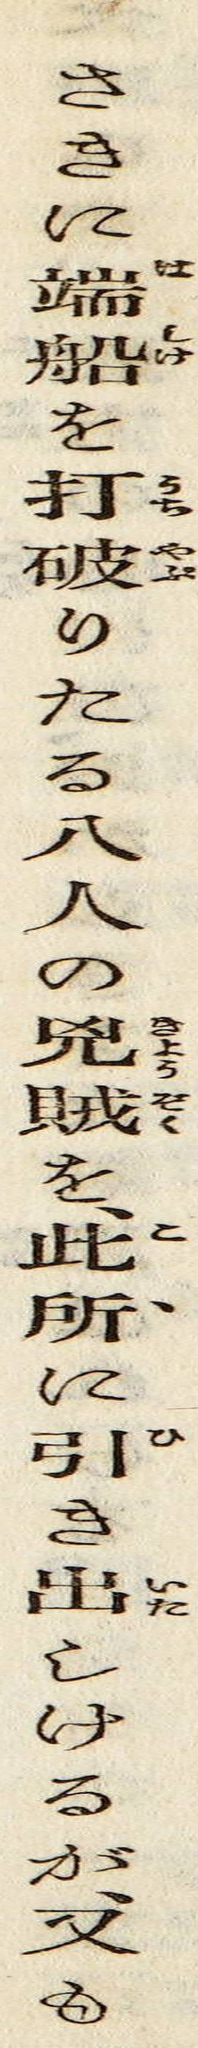さきに端船を打破りたる八人の凶賊を、此所に引き出しけるが、又も
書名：日本漂流譚
